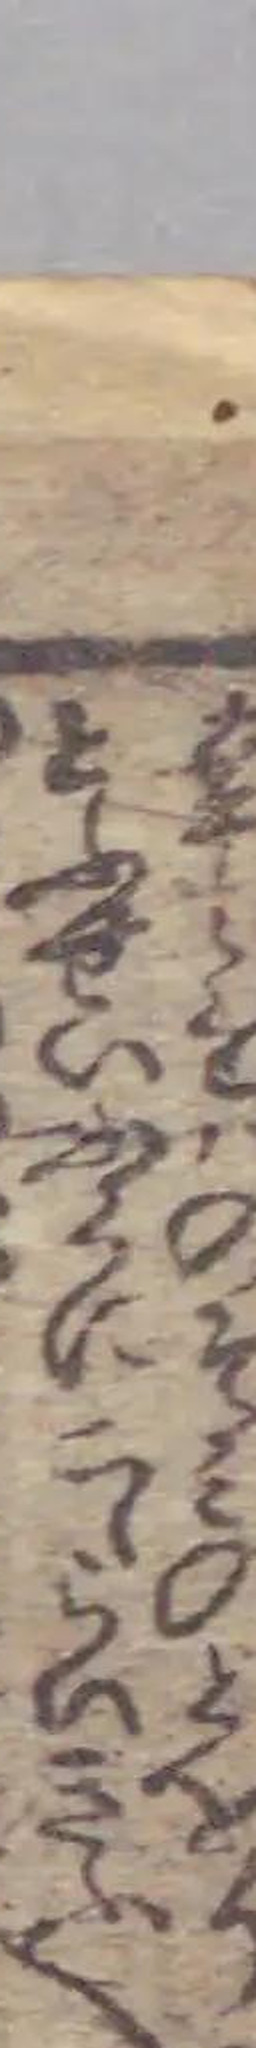とふせいふうにこしらいきふ
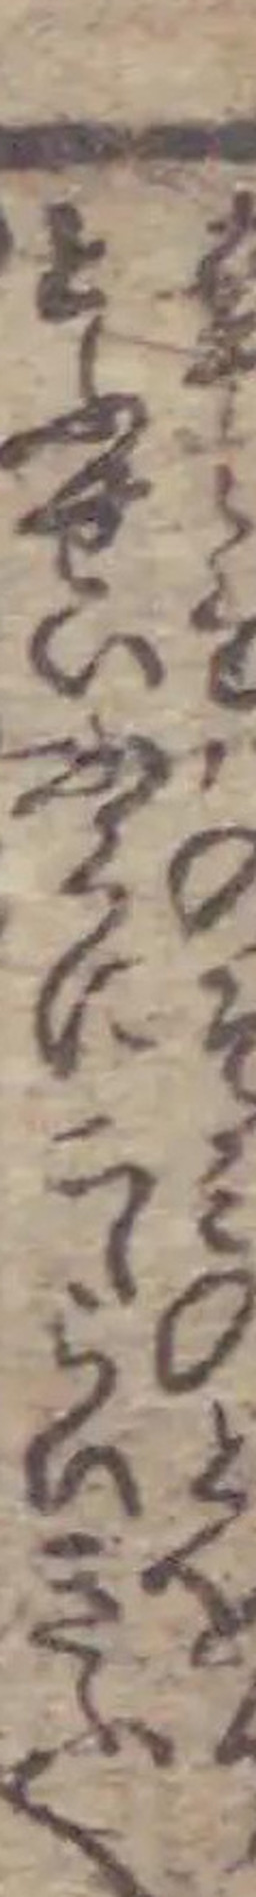とふせいふうにこしらいきふ
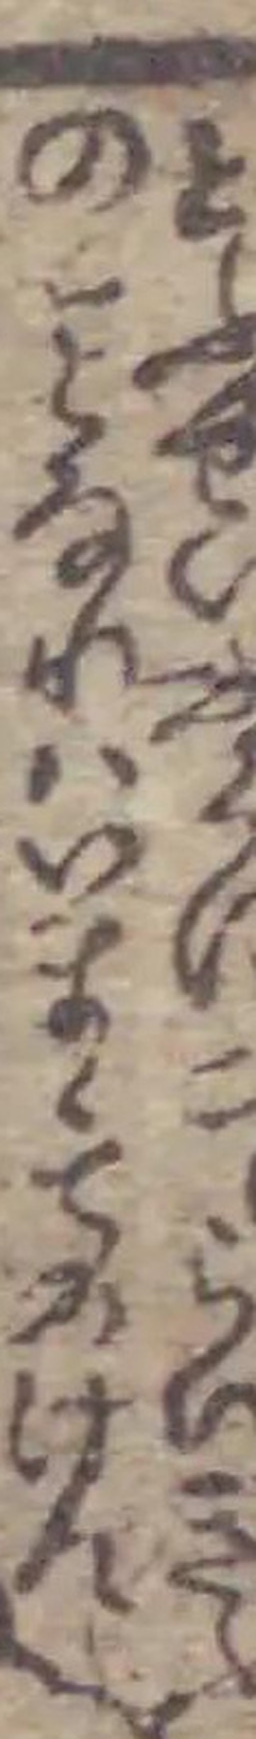のことなれはいまゝてのけん
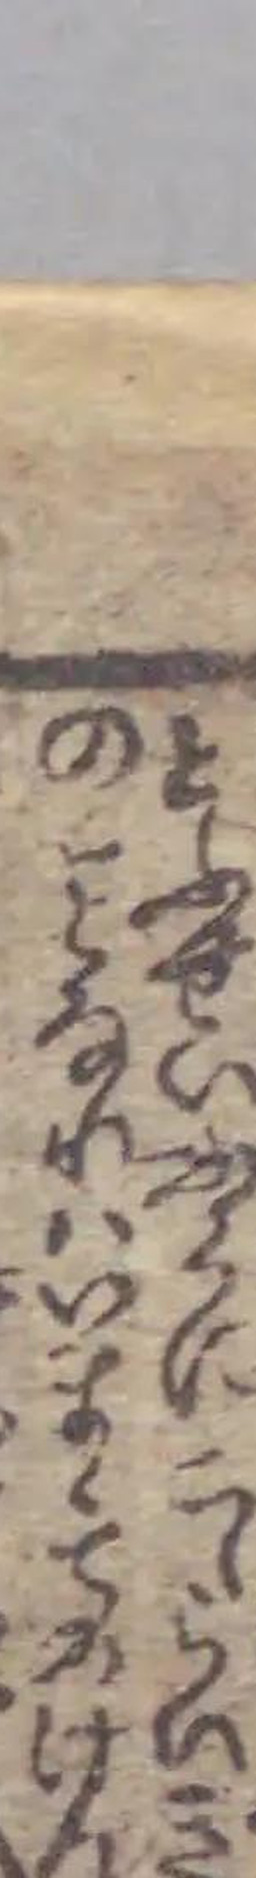のことなれはいまゝてのけん
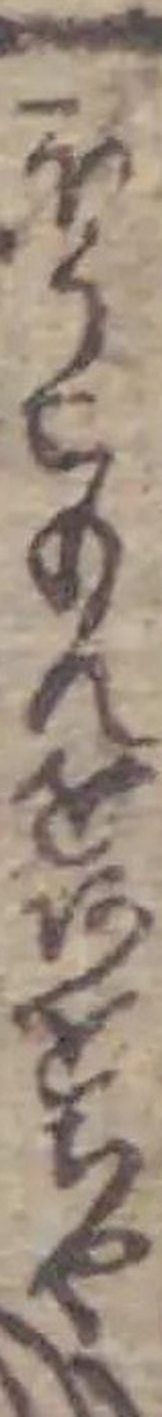ほうこもんをあをちや
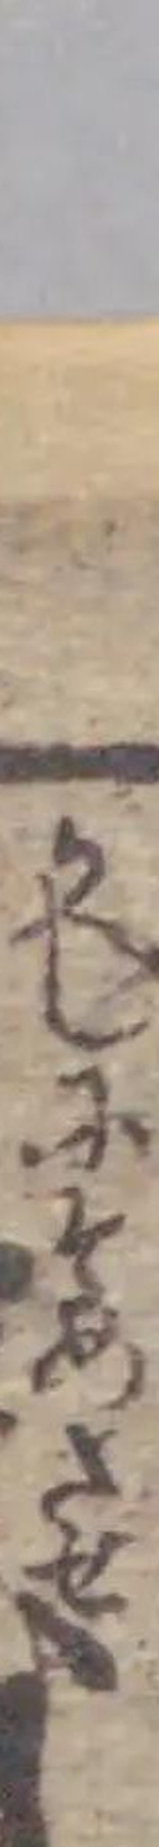かへしにそめさせ
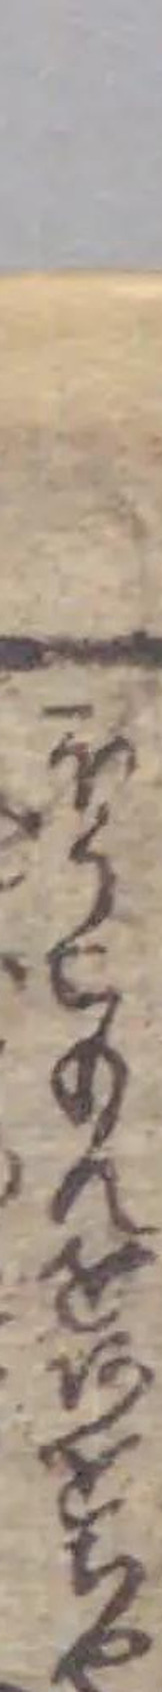ほうこもんをあをちや
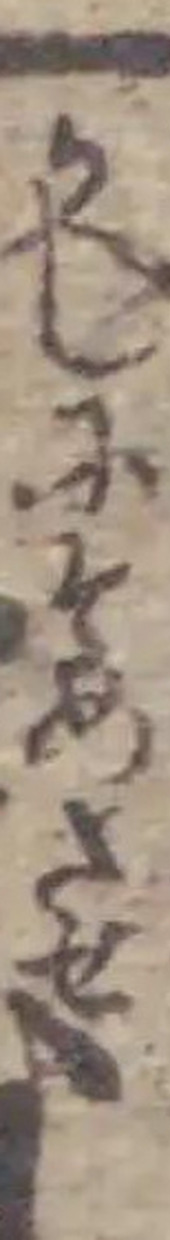かへしにそめさせ
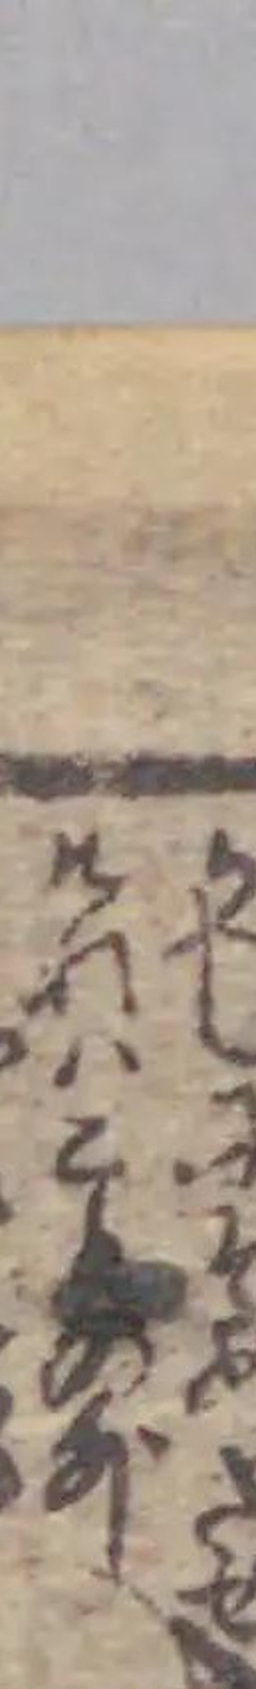けれはことの外
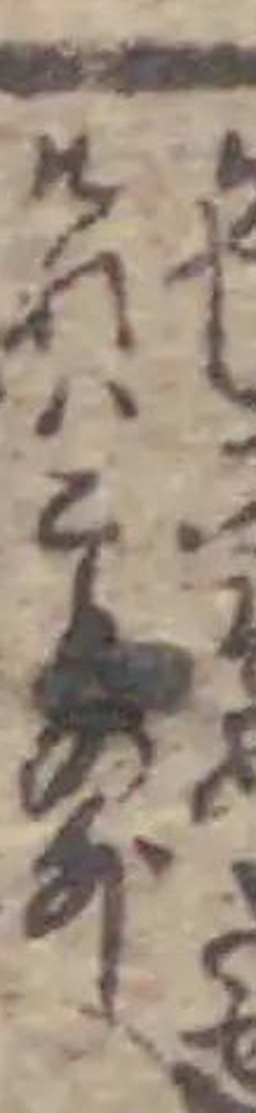けれはことの外
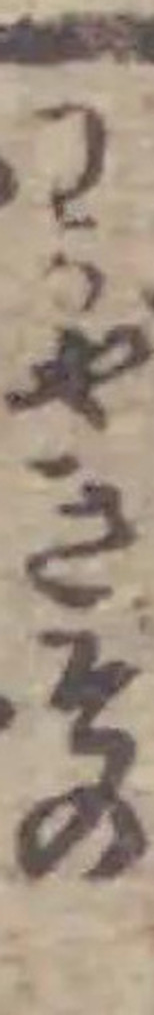わかやきその
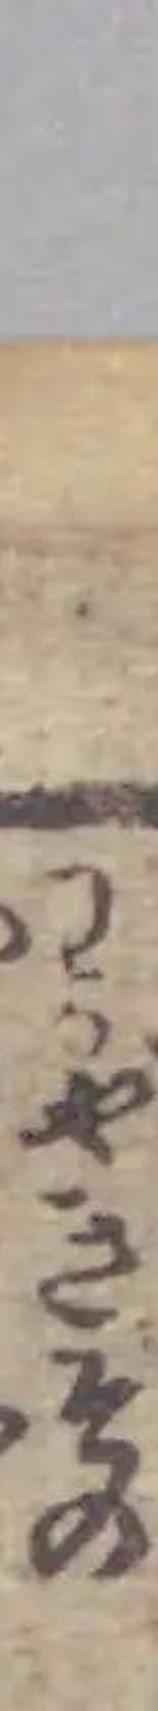わかやきその
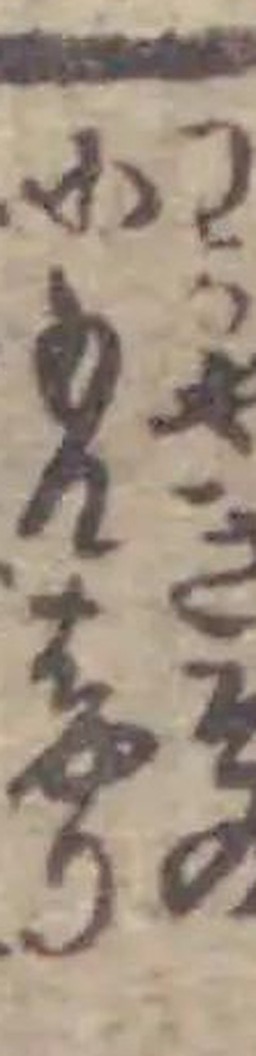小もんはやり
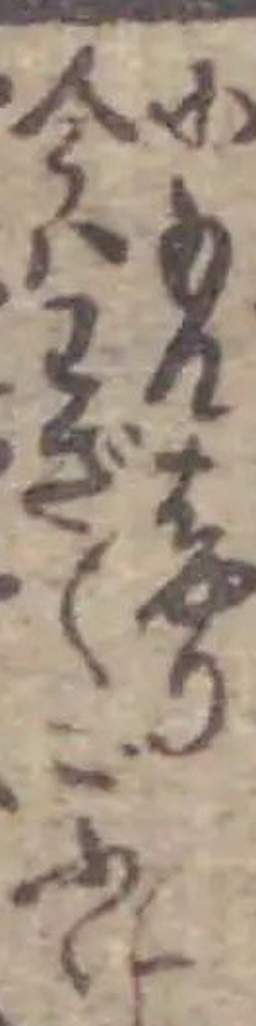今はわざ〳〵ごふく
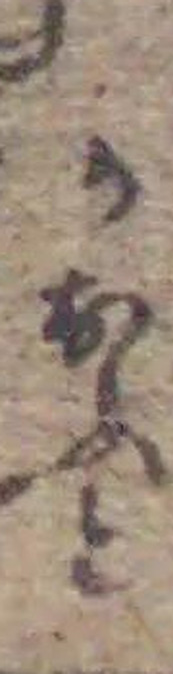かおふと
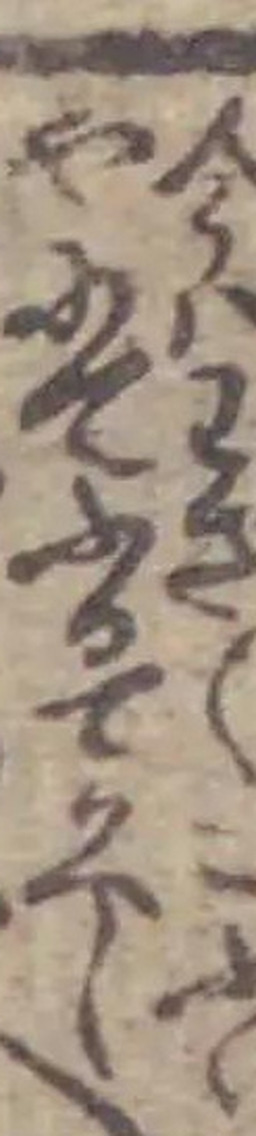やにてふるてかへし
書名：日待御利生此ごろ噂 3巻
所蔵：国立国会図書館 National Diet Library, JAPAN
